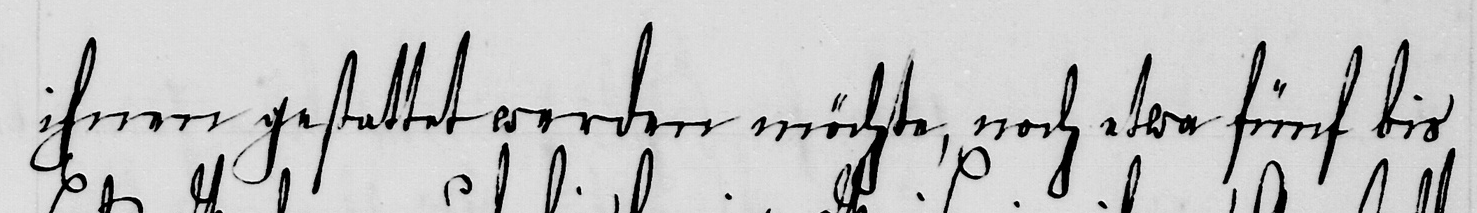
ihnen gestattet werden möchte, noch etwa fünf bis
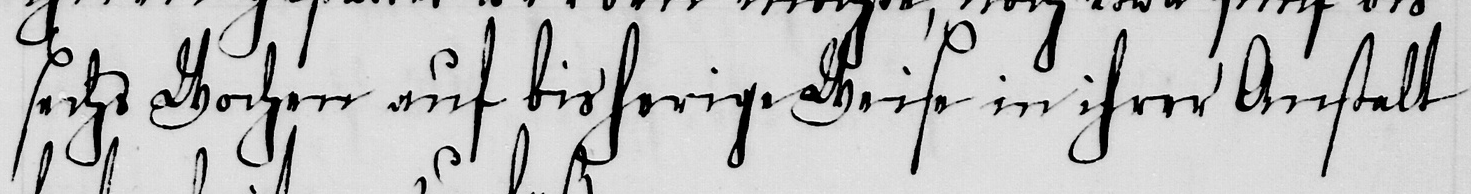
sechs Wochen auf bisherige Weise in ihrer Anstalt
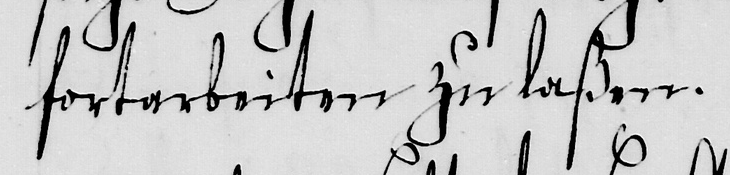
fortarbeiten zu laßen.
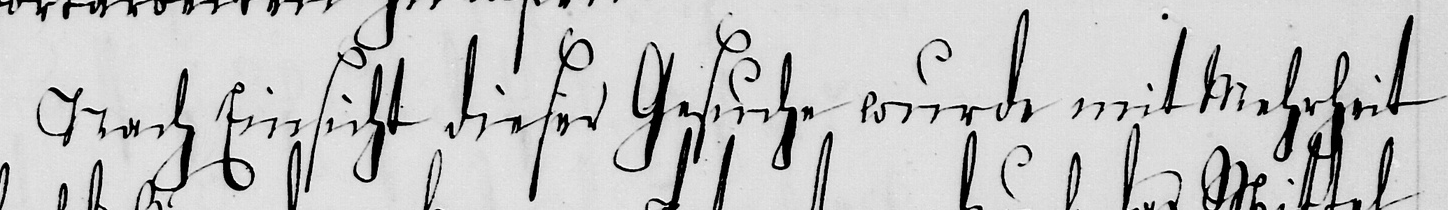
Nach Einsicht dieser Gesuche wurde mit Mehrheit
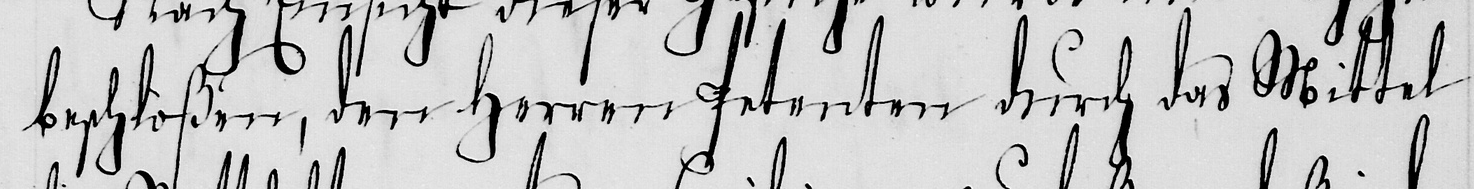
beschloßen, den Herren Petenten durch das Mittel
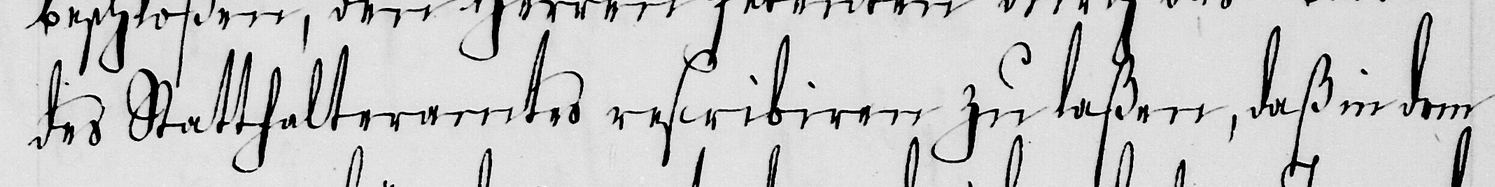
des Statthalteramtes rescribiren zu laßen, daß in dem
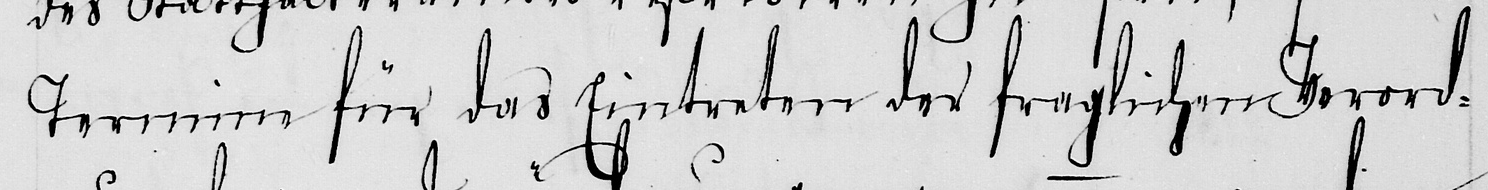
Termine für das Eintreten der fraglichen Verord¬
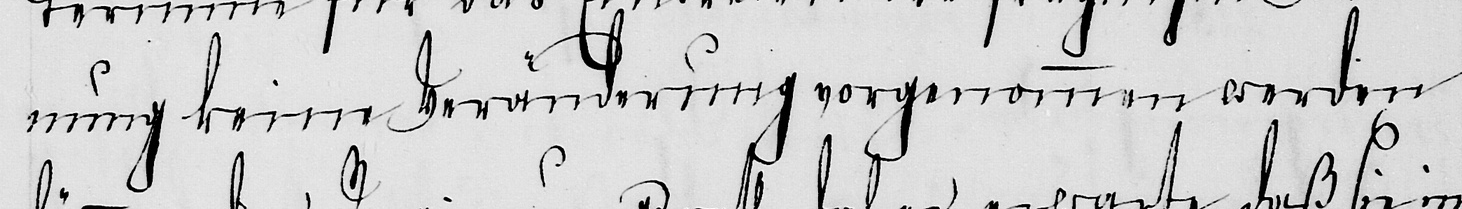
nung keine Veränderung vorgenommen werden
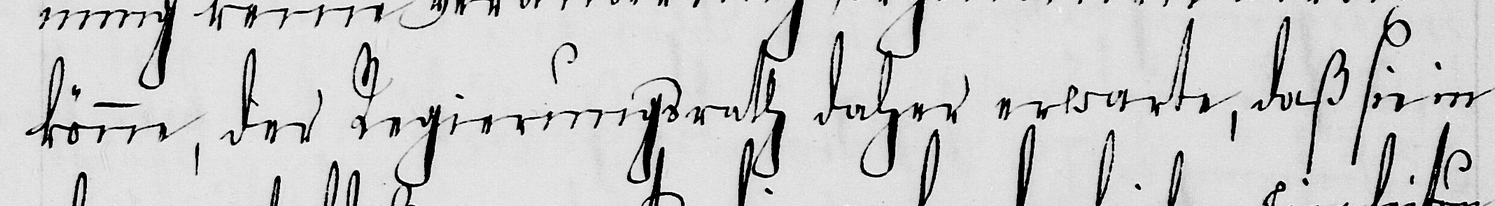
könne, der Regierungsrath daher erwarte, daß sie in
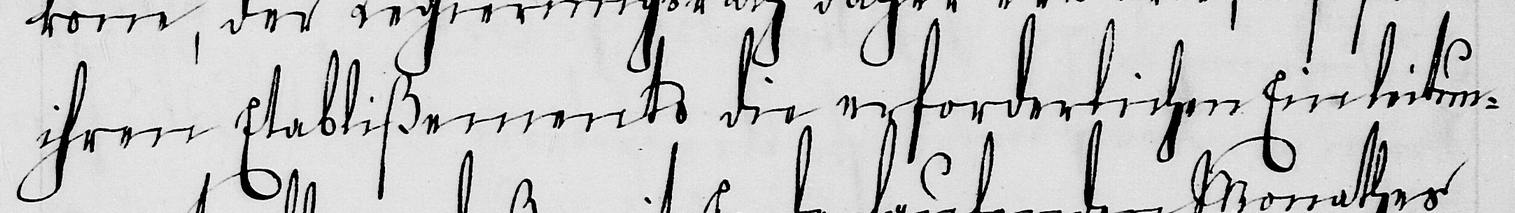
ihren Etablißements die erforderlichen Einleitun¬
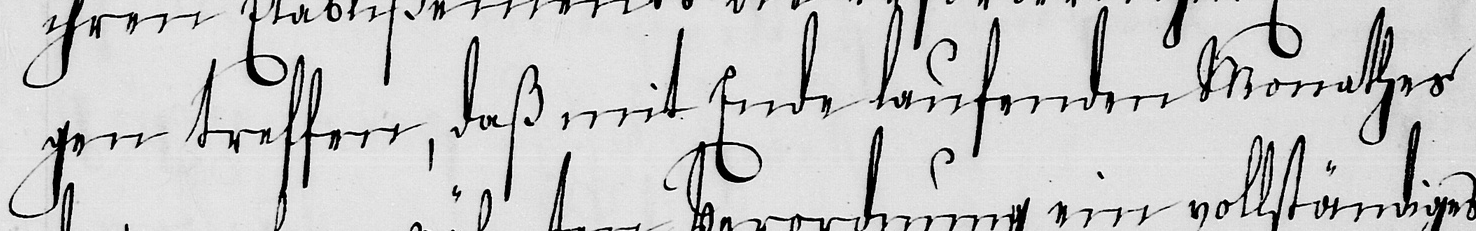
gen treffen, daß mit Ende laufenden Monathes
